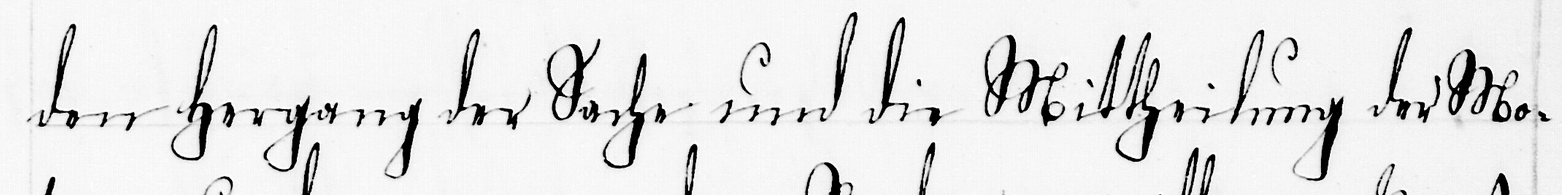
den Hergang der Sache und die Mittheilung der Mo¬
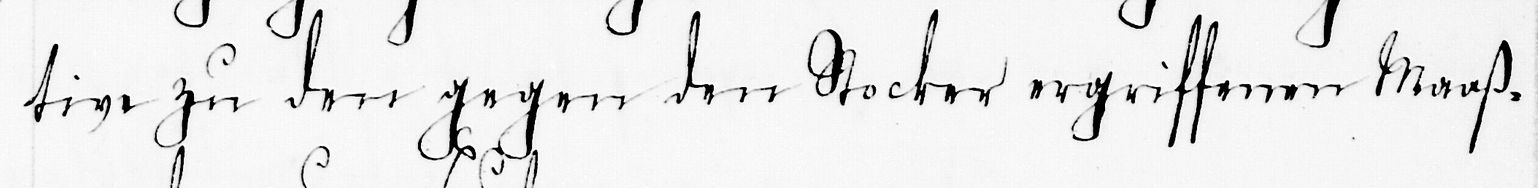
tive zu den gegen den Stocker ergriffenen Maaß¬
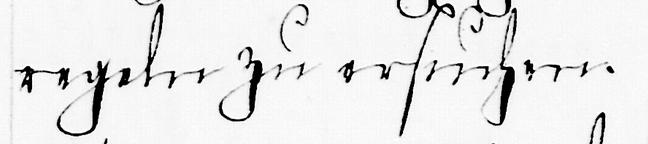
regeln zu ersuchen.
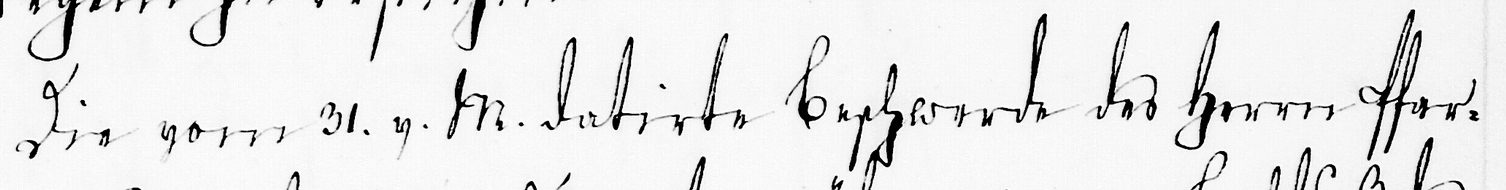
Die vom 31. v. M. datirte Beschwerde des Herrn Pfar¬
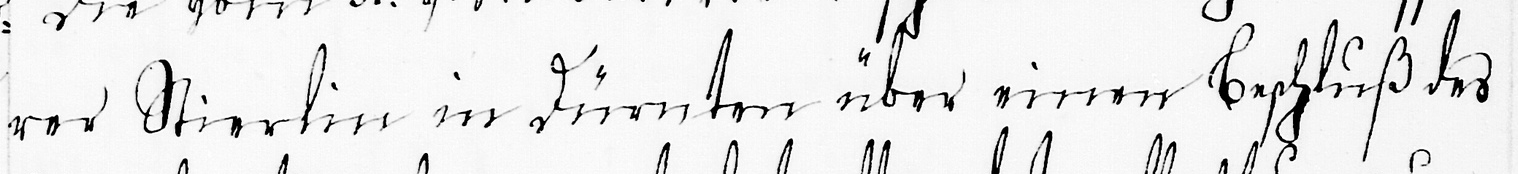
rer Stierlin in Dürnten über einen Beschluß des
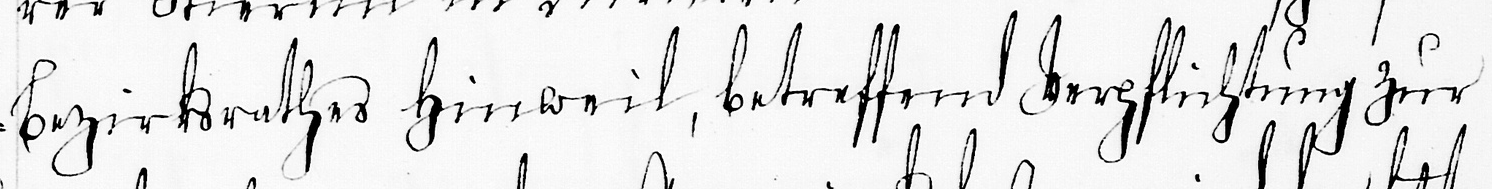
Bezirksrathes Hinweil, betreffend Verpflichtung zur
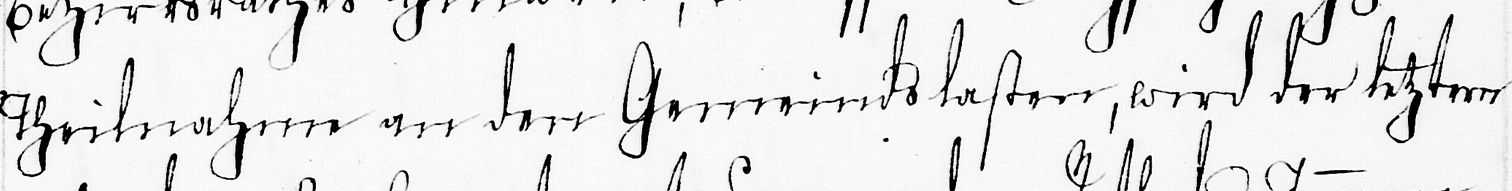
Theilnahme an den Gemeindslasten, wird der leztern
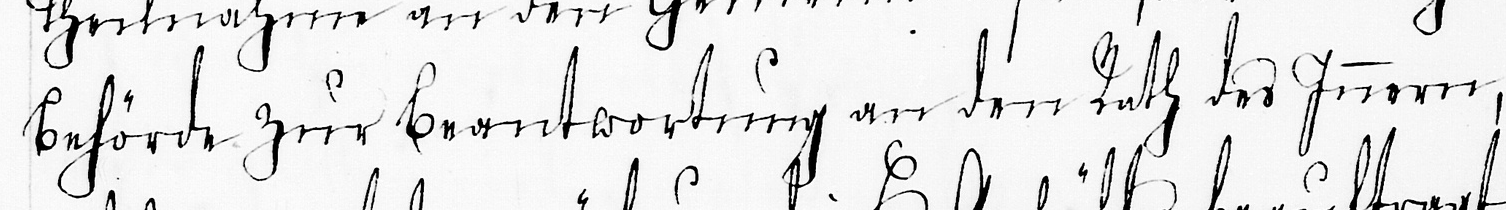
Behörde zur Beantwortung an den Rath des Innern,
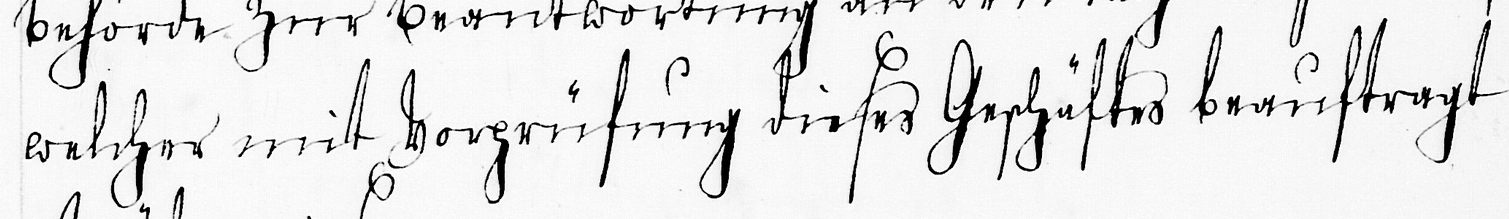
welcher mit Vorprüfung dieses Geschäftes beauftragt
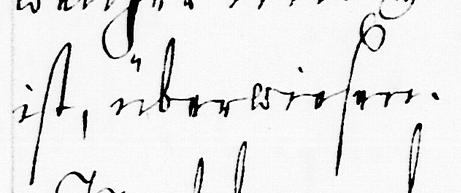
ist, überwiesen.
